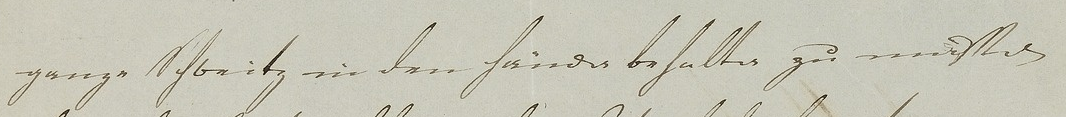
ganze Schweitz in den Händen behalten zu müssen.
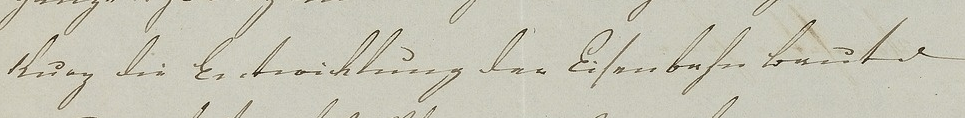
Kurz die Entwicklung der Eisenbahn Bauten
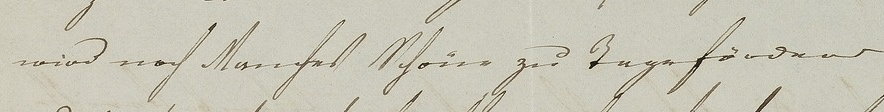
wird noch Manches Schönes zu Tage fördern. –
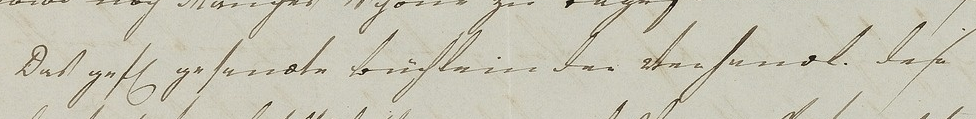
Das gef. gesendete Büchlein der Verhandl. der
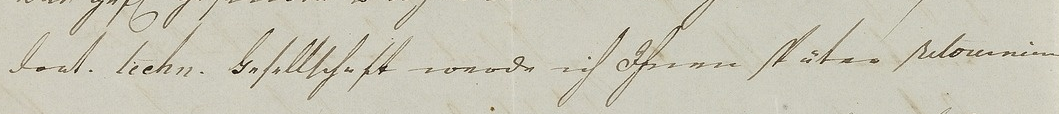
dort. techn. Gesellschaft werde ich Ihnen später retournieren.
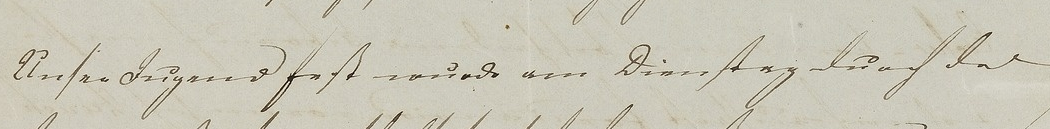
Unser Jugend Fest wurde am Dienstag durch den
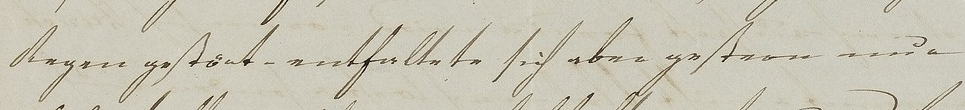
Regen gestört, entfaltete sich aber gestern nun
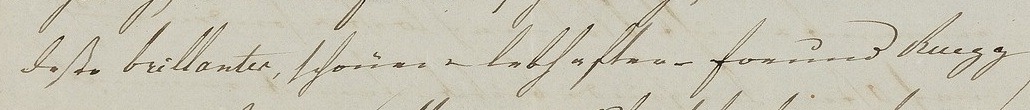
desto brillanter, schöner & lebhafter. Freund Ruegg
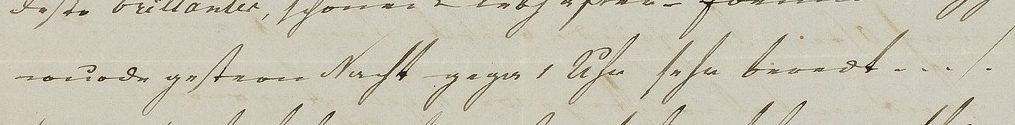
wurde gestern Nacht gegen 1 Uhr sehr beredt....
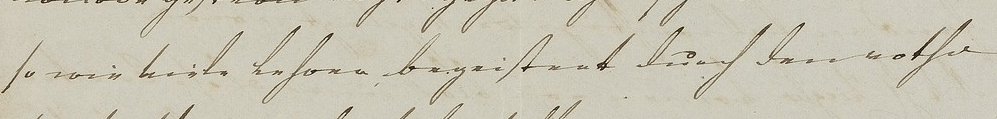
so wie viele Lehrer begeistert durch den rothen
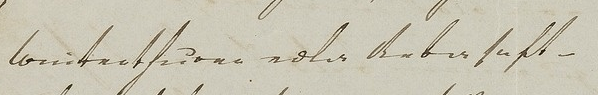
Winterthurer edlen Rebensaft.
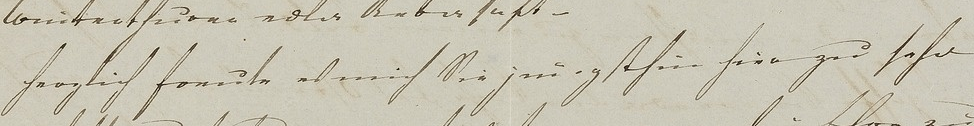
Herzlich freute es mich Sie jüngsthin hier zu sehen
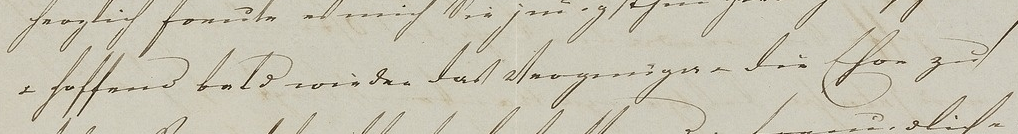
& hoffend bald wieder das Vergnügen & die Ehre zu
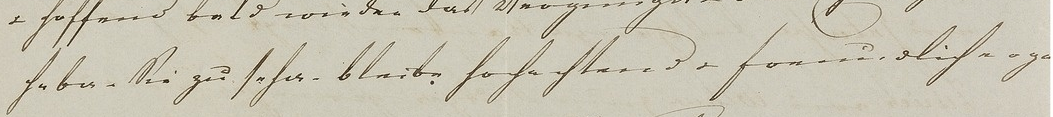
haben, Sie zu sehen, bleibe hochachtend & freundlich erg
